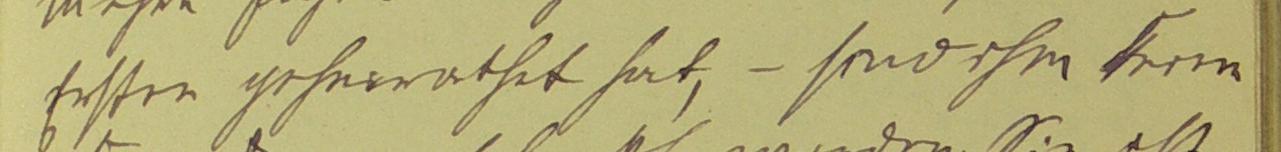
Ersten geheiratet hat,- sind ihm keine
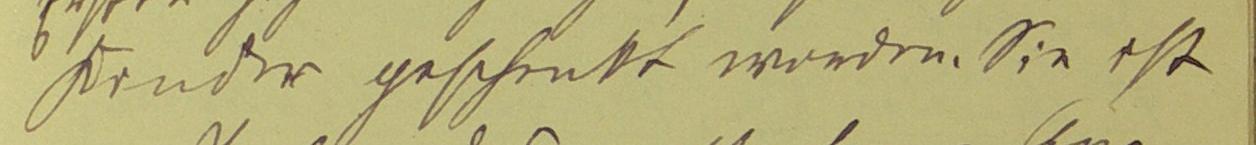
Kinder geschenkt worden. Sie ist
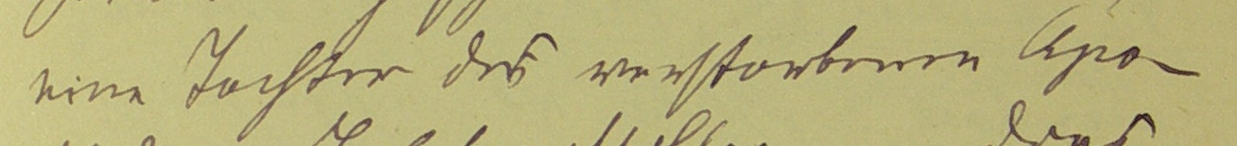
eine Tochter des verstorbenen Apo¬
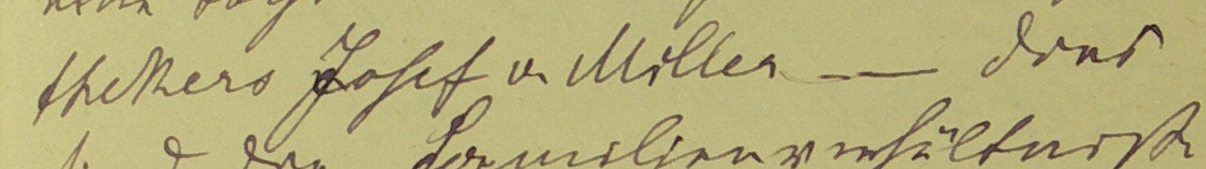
thekers Josef von Miller,- Dies
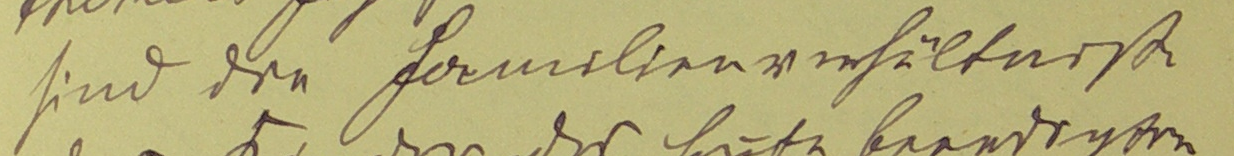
sind die Familienverhältnisse
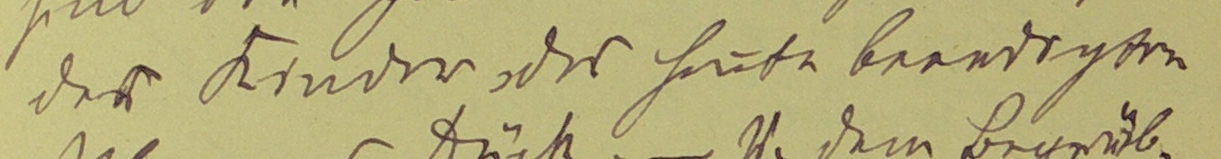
der Kinder des heute beerdigten
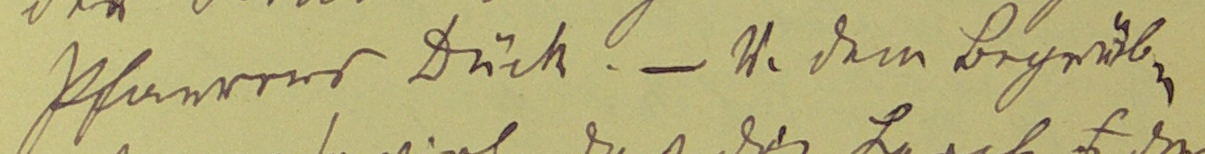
Pfarrers Dück.- Von dem Begräb¬
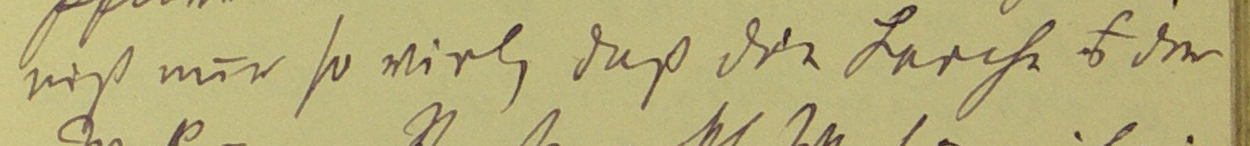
nis nur so viel, daß der Sarg aus der
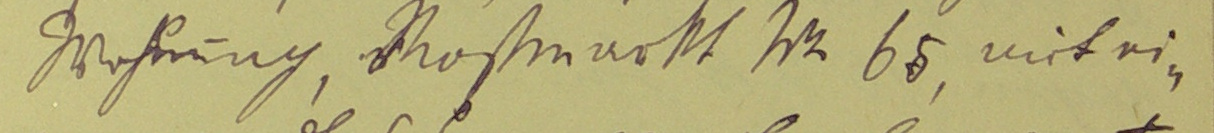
Wohnung, Roßmarkt 65 mit ei¬
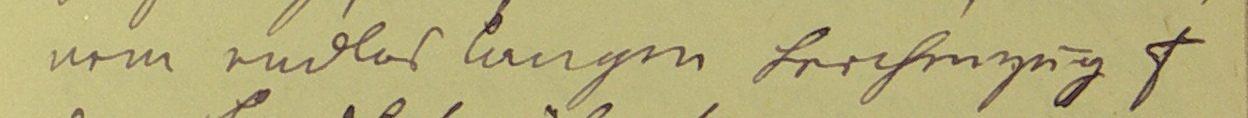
nem endlos langen Leichenzug auf
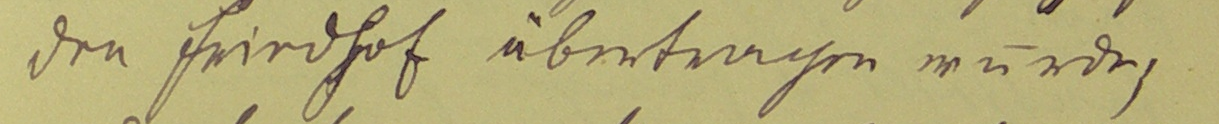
den Friedhof übertragen wurde,
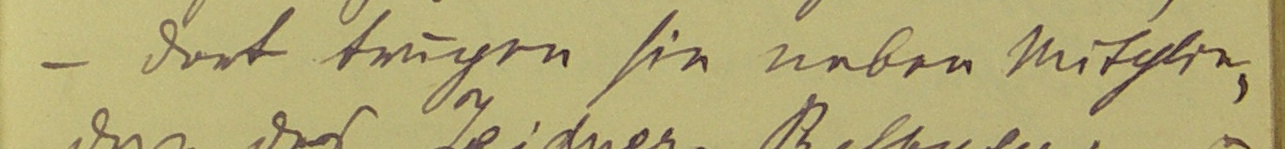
-dort trugen sie neben Mitglie¬
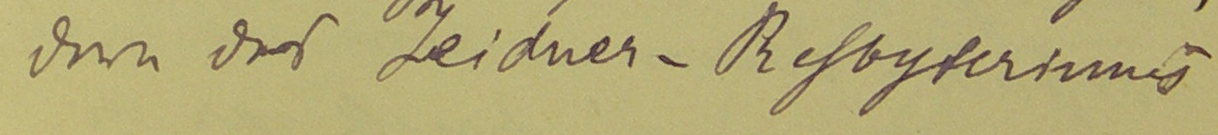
dern des Zeidner- Presbyteriums
